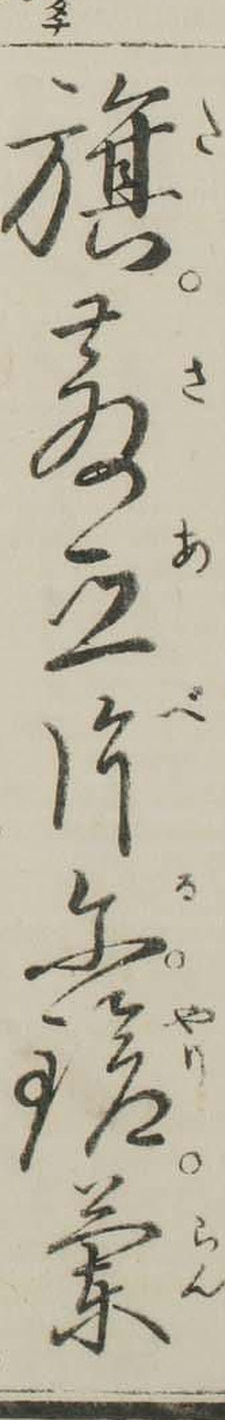旗。散亜片尓。鎗。蘭
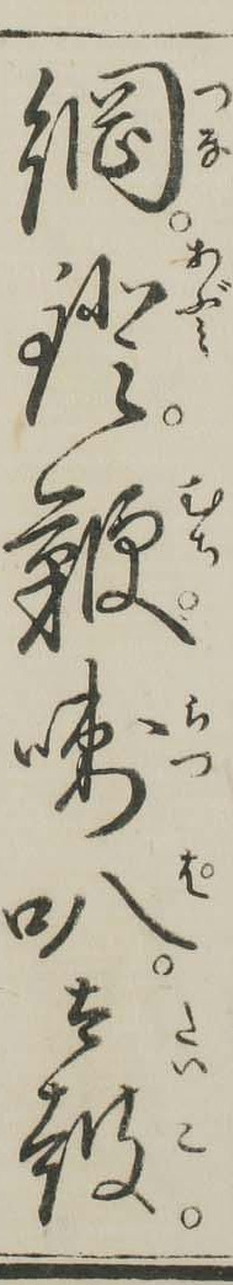綱。鐙。鞭。喇叭。太鼓。
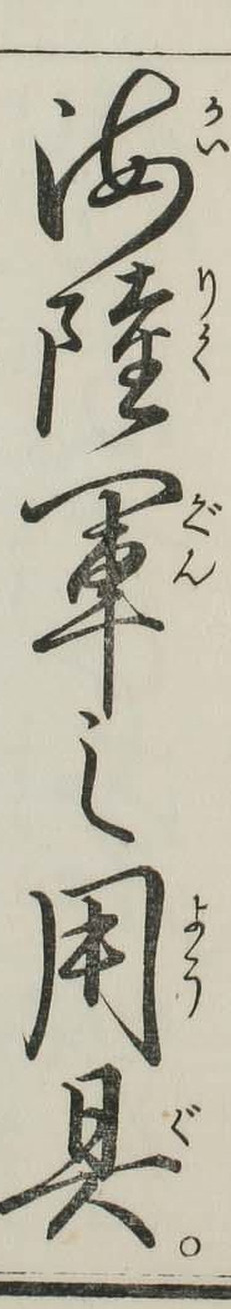海陸軍之用具。
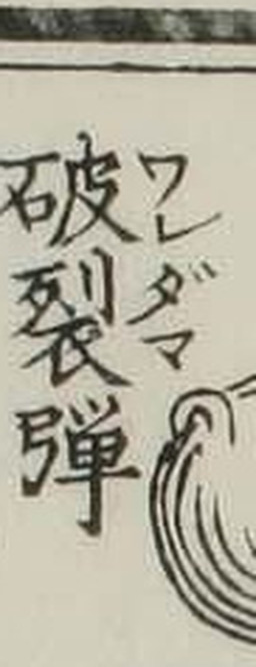破裂弾
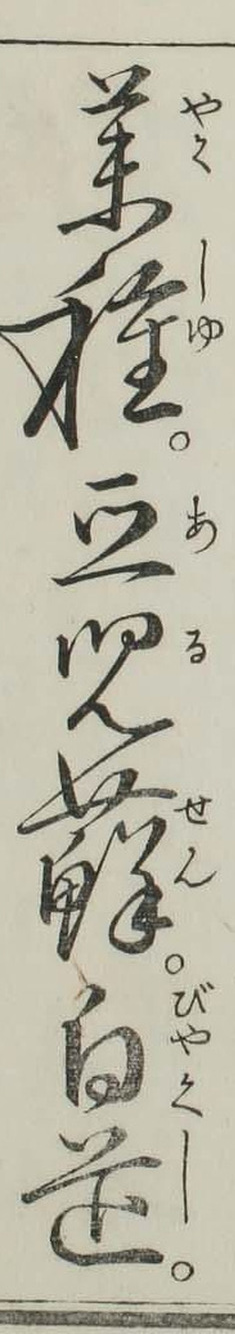薬種。亜児蘚。白芷。

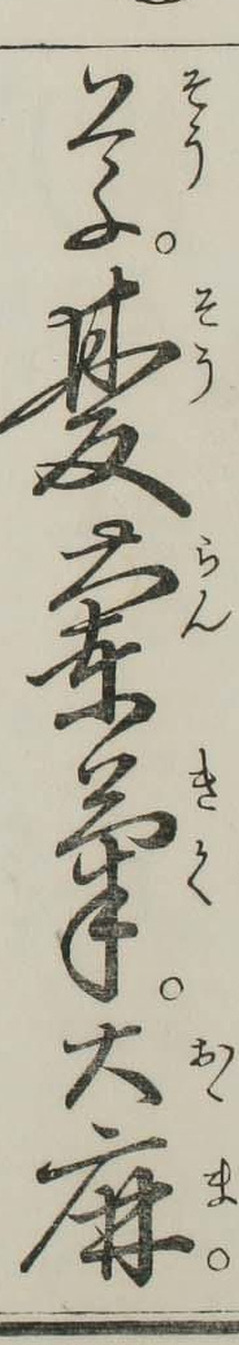草。双蘭菊。大麻。
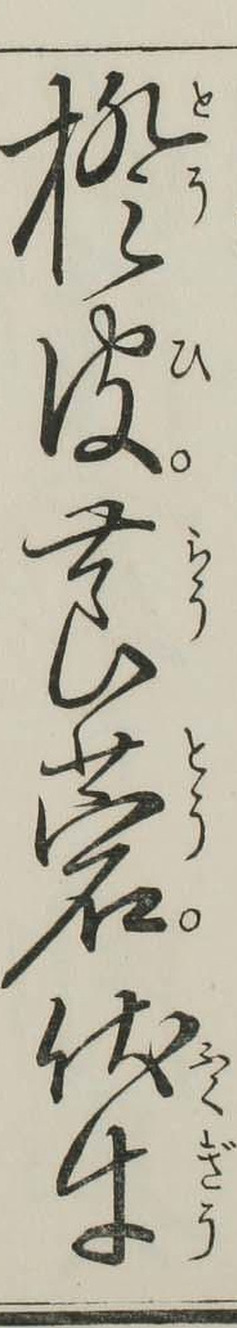橙皮。莨菪。伏牛

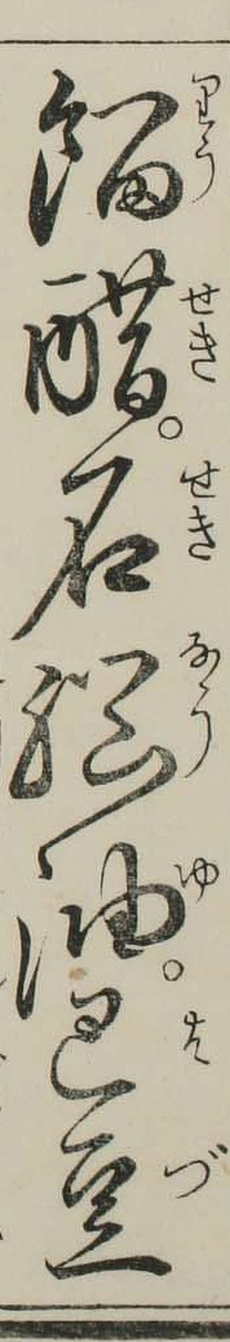留醋。石脳油。巴豆
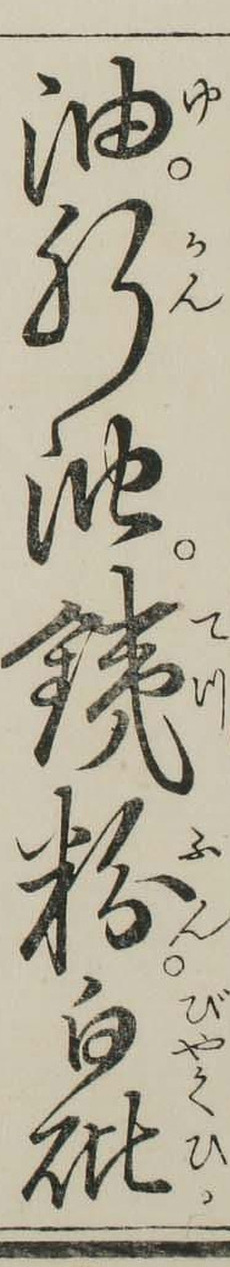油。肝油。鉄粉。白砒。
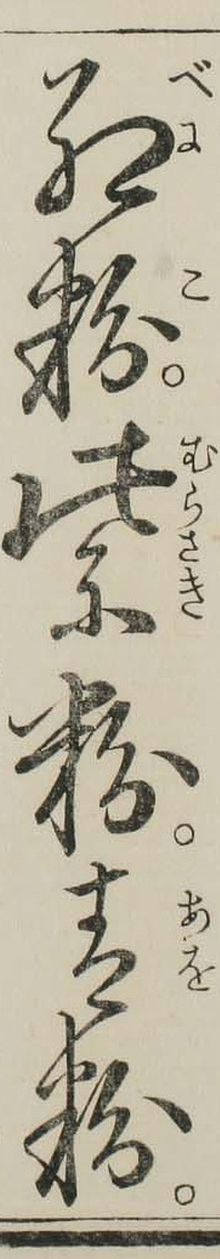紅粉。紫粉。青粉。
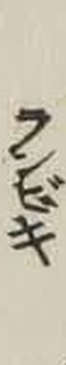ランビキ
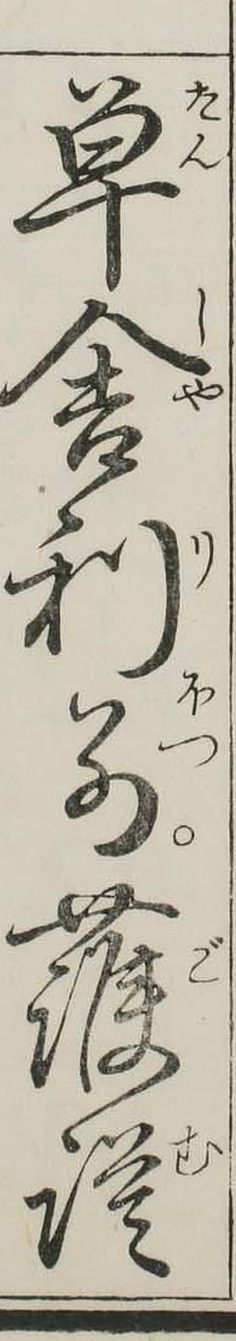単舎利別。護謨
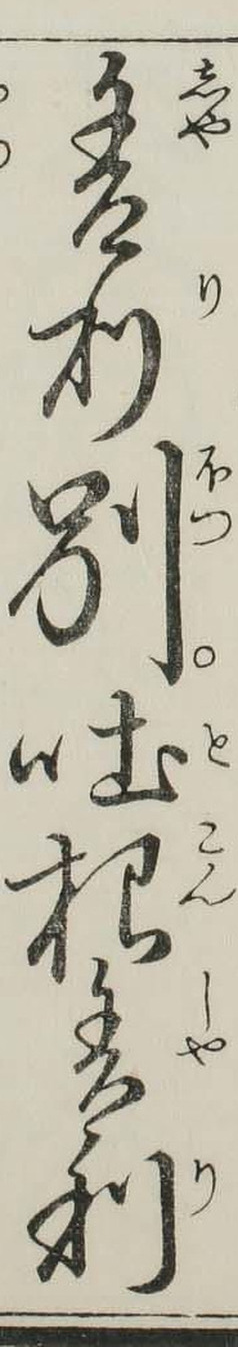舎利別。吐根舎利
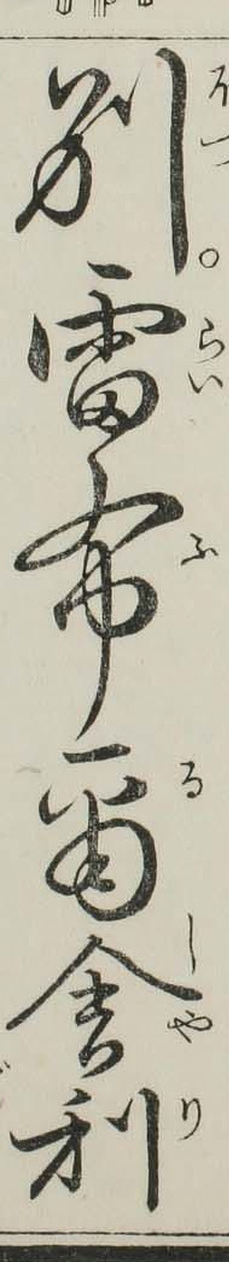別。雷布爾舎利

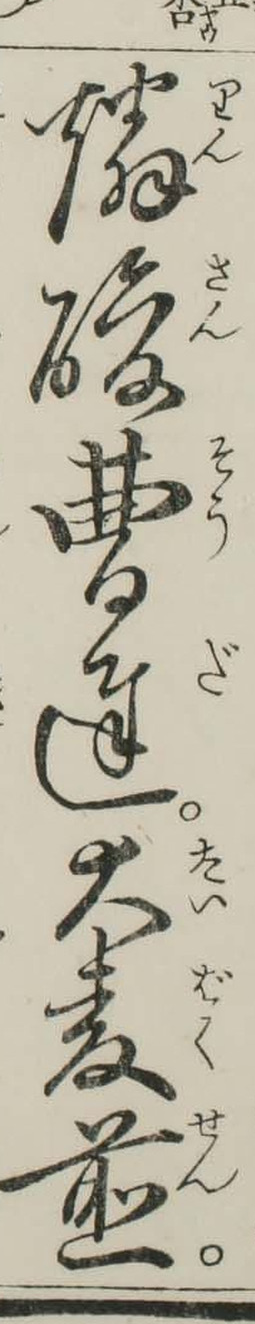燐酸曹達。大麦煎。
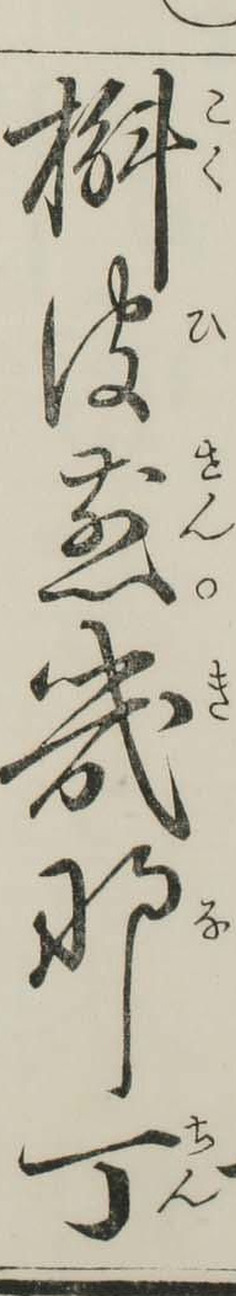槲皮煎。幾那丁
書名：開化往来
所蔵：東京学芸大学教育コンテンツアーカイブ
